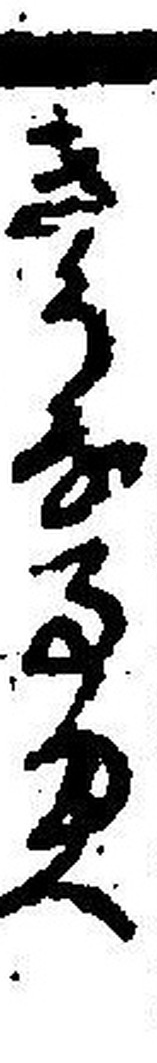きうな事ゆへ
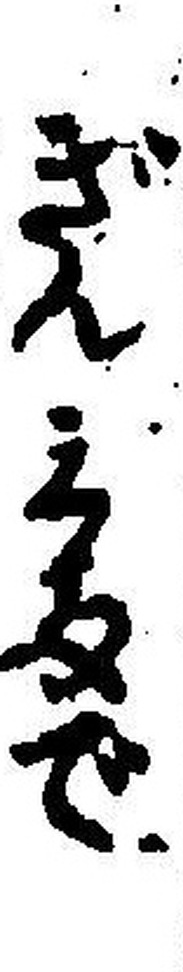ぎん三両で
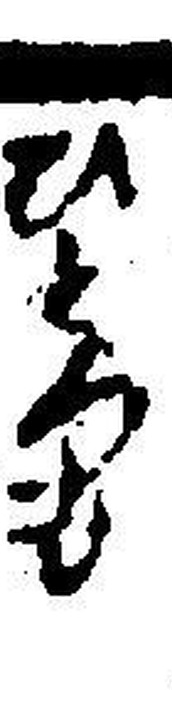ひとつも
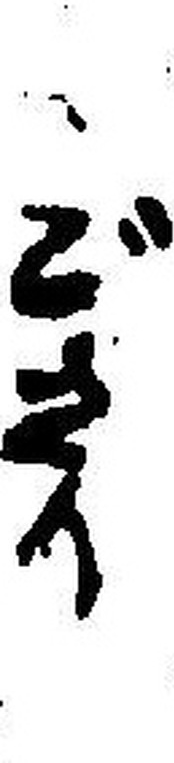ごさり
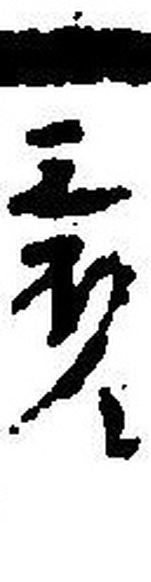三ほん
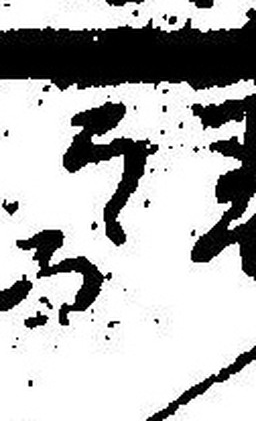こゝろ
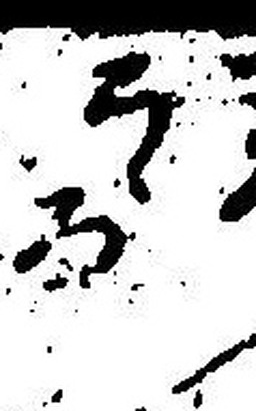こゝろ
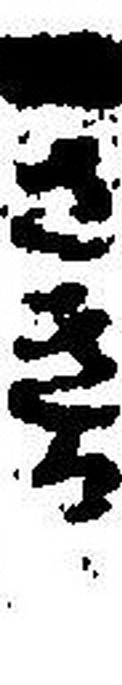さきか
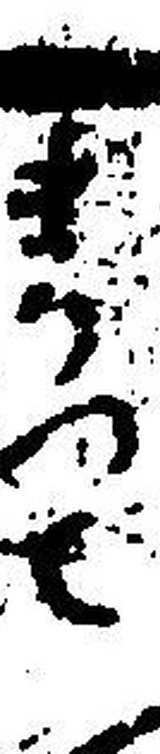まかつて
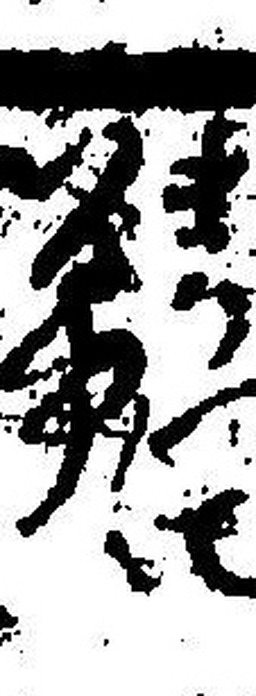いるゆ
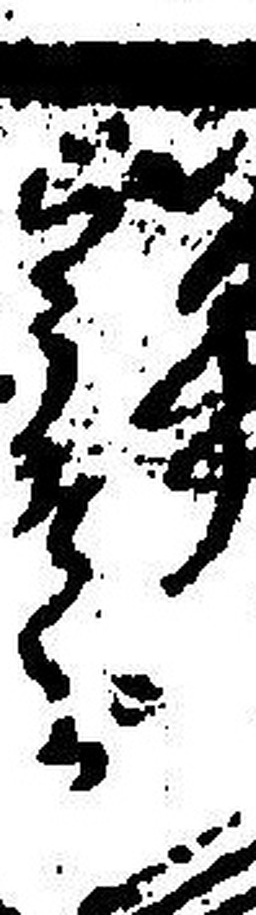らうそくが
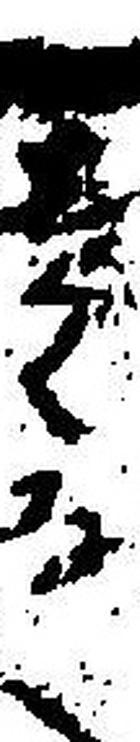しかくな
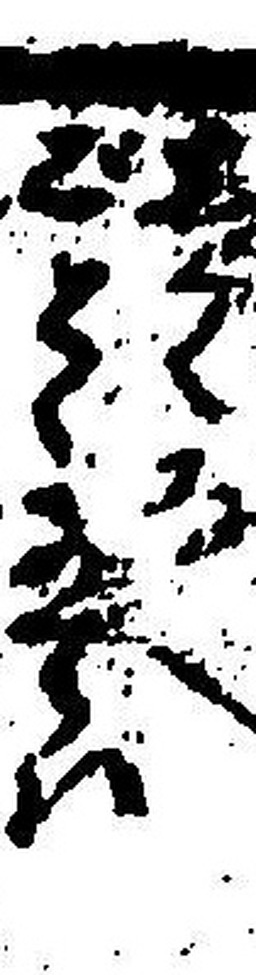ごとくにては
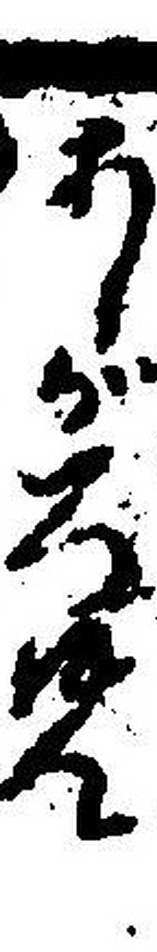あしが一つほん
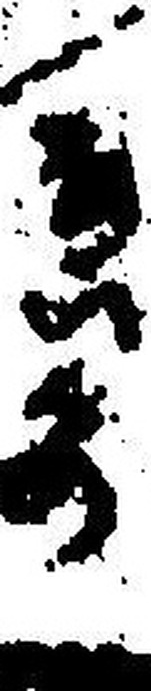ないかの
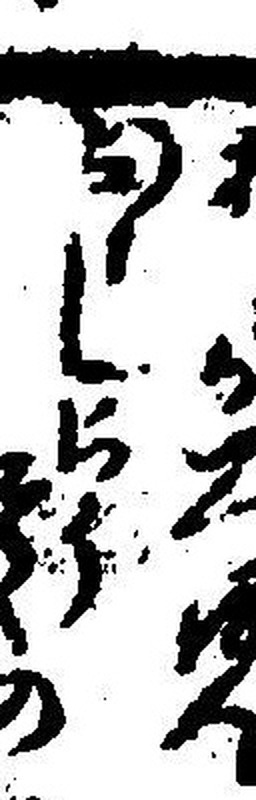おゝしらう
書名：御代参牛時詣 / 市場通笑作
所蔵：東京大学総合図書館 General Library in the University of Tokyo, JAPAN
